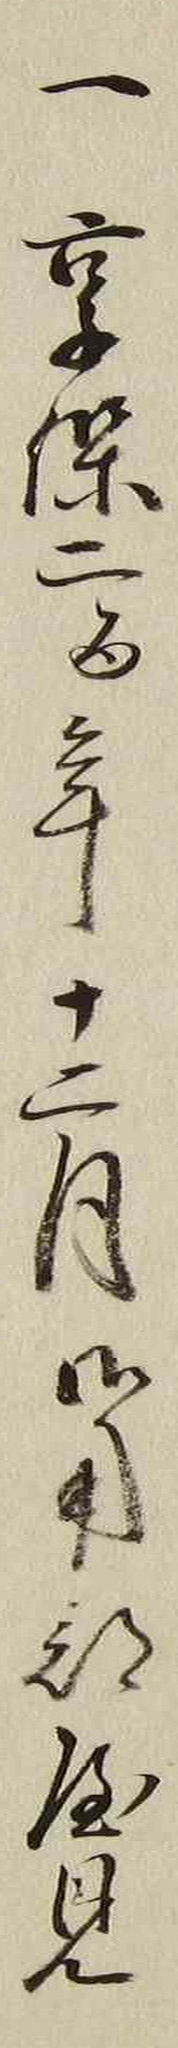一享保二酉年十二月御用部屋見
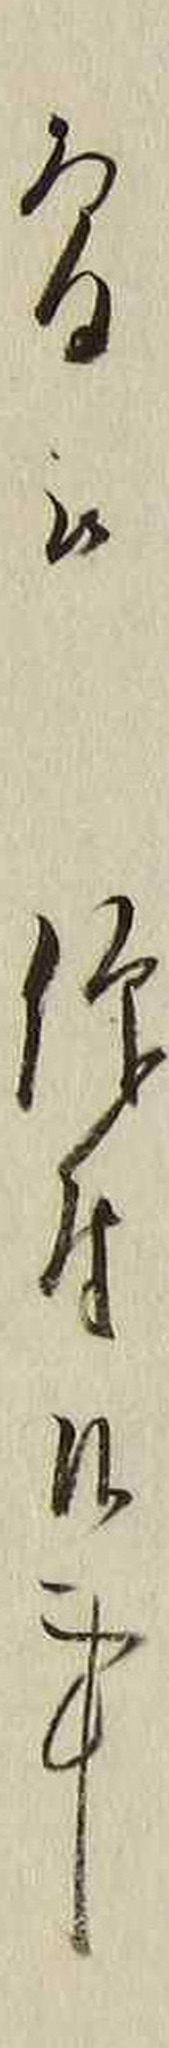習被仰付候事
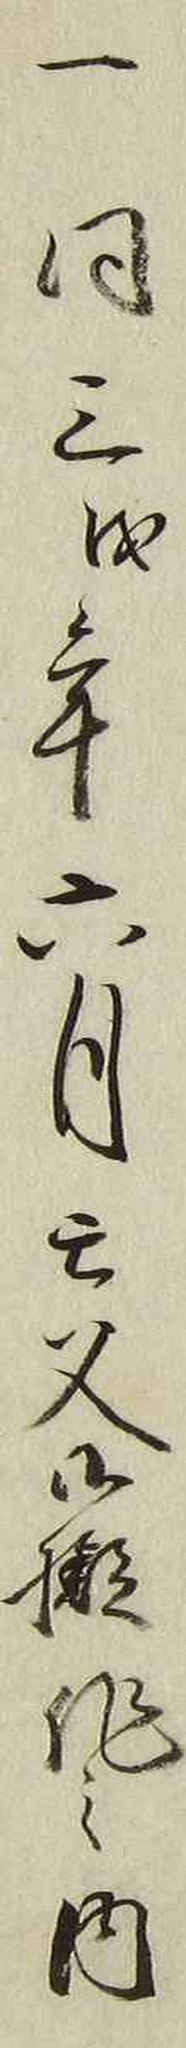一同三戌年六月亡父御擬作之内
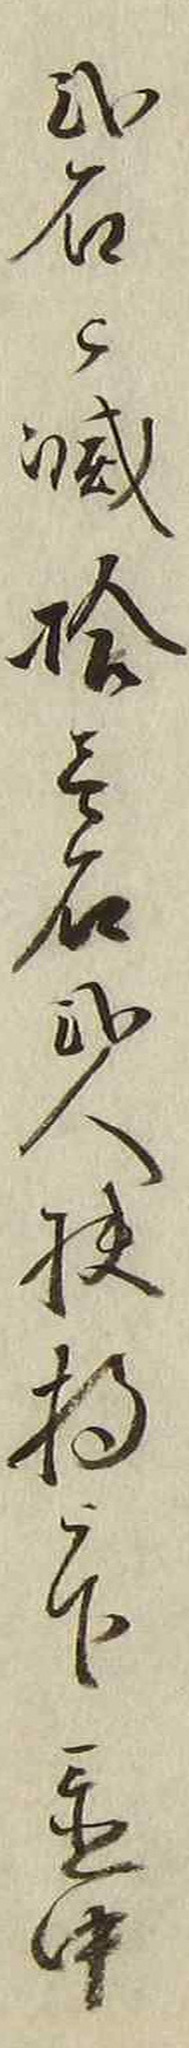弐石被減拾壱石弐人扶持被下置中

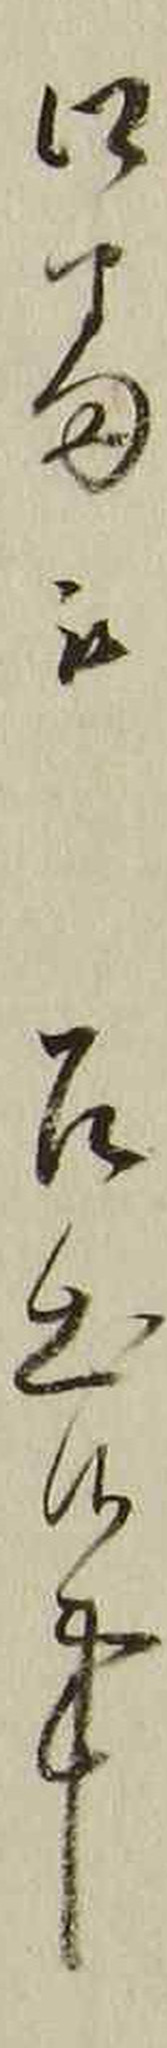口番被召出候事
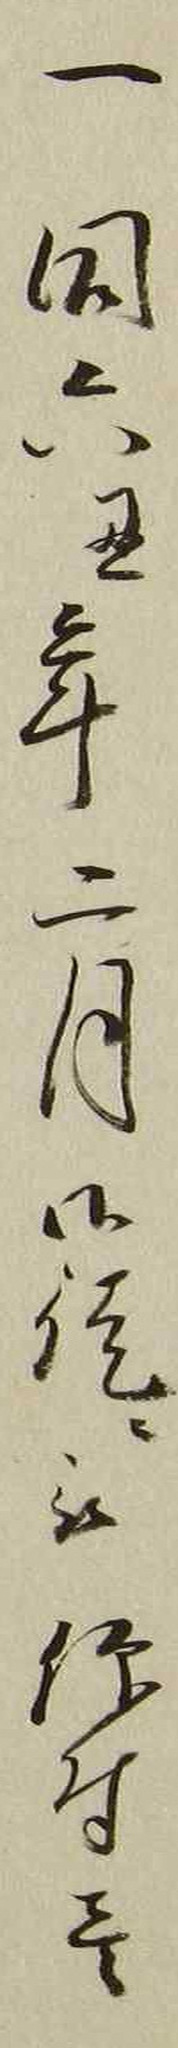一同六丑年二月御徒ニ被仰付壱
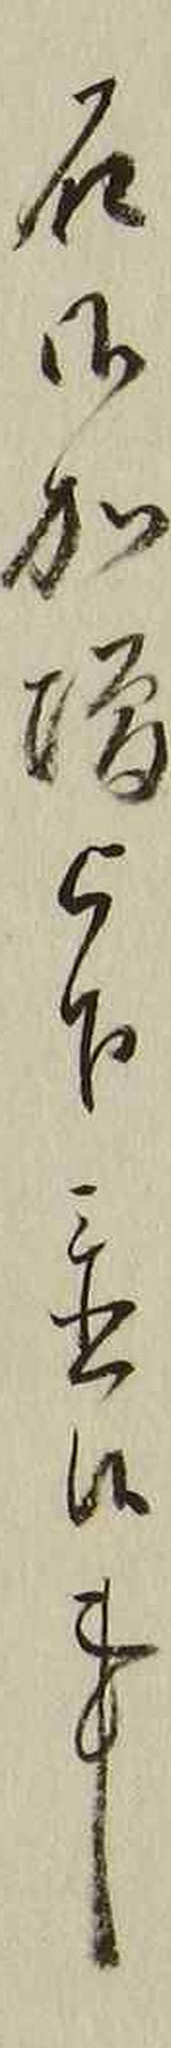石御加増被下置候事
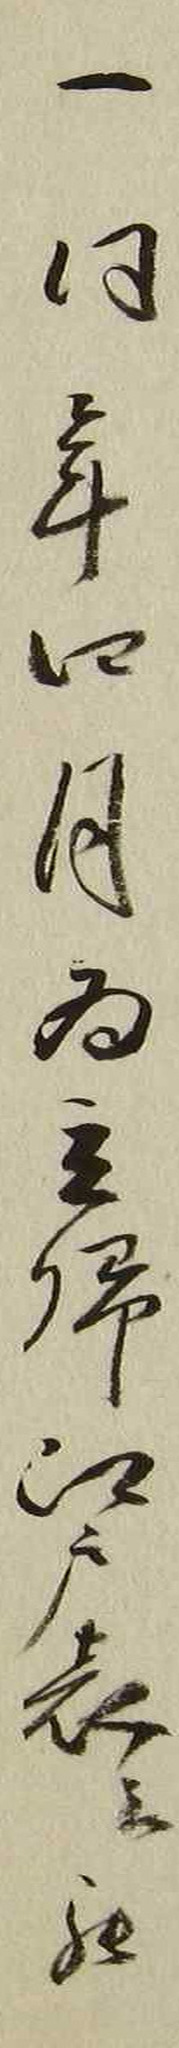一同年四月為立帰江戸表江罷
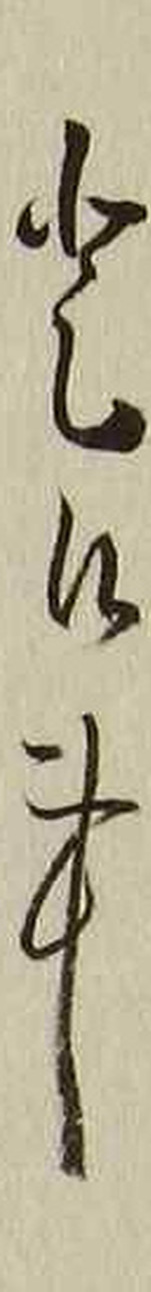登候事
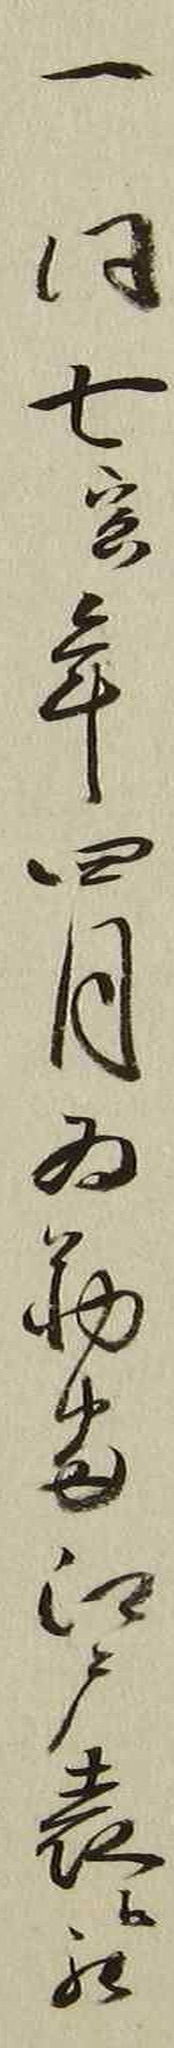一同七寅年四月為勤番江戸表江罷
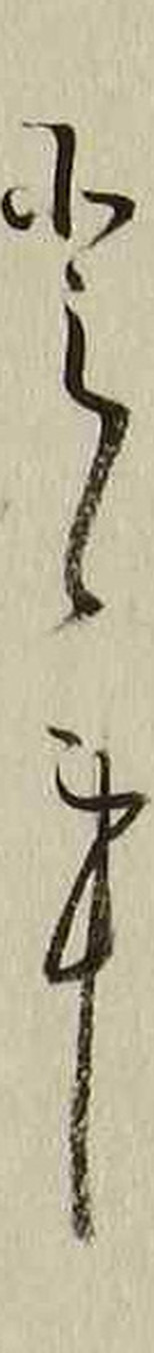登候事
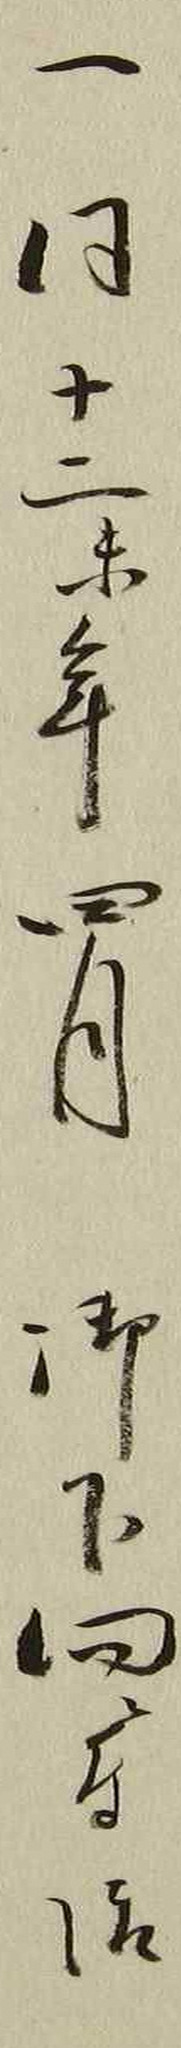一同十二未年四月御下向ニ付御
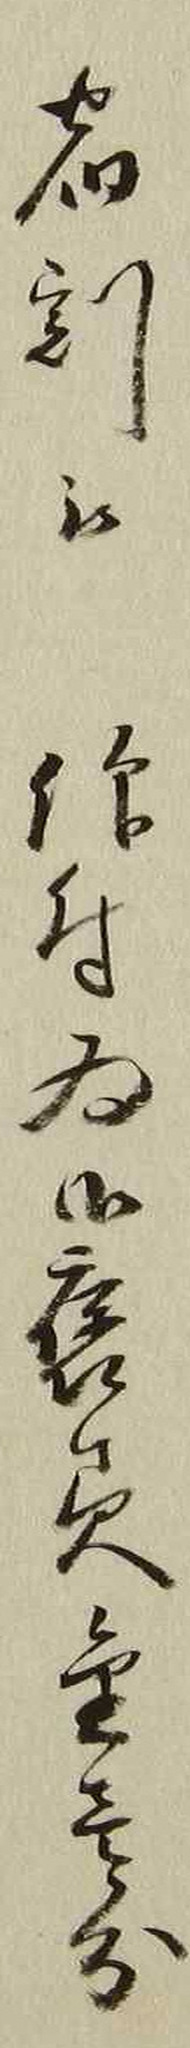宿割被仰付為御褒美金壱分
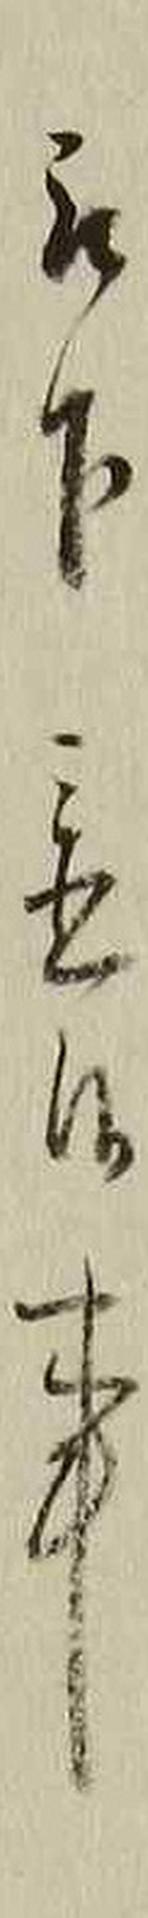被下置候事
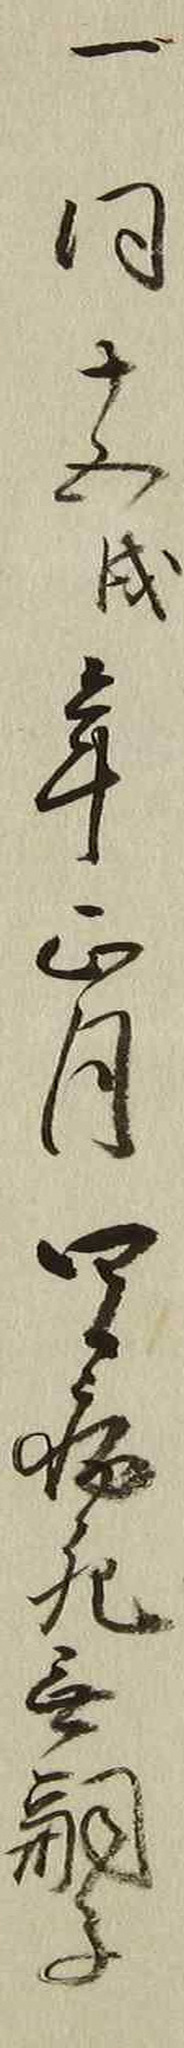一同十五戌年正月四日病死無嗣子
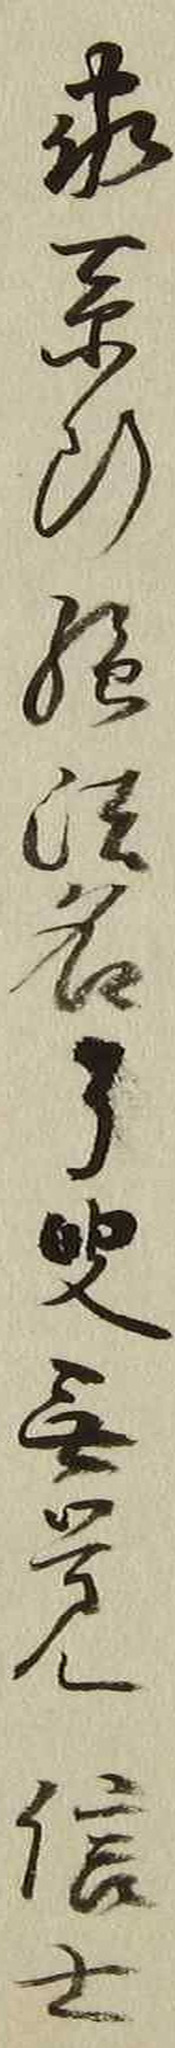家系断絶法名了叟無覚信士
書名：諸士系譜　巻之32　い之部32
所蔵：会津若松市立会津図書館
